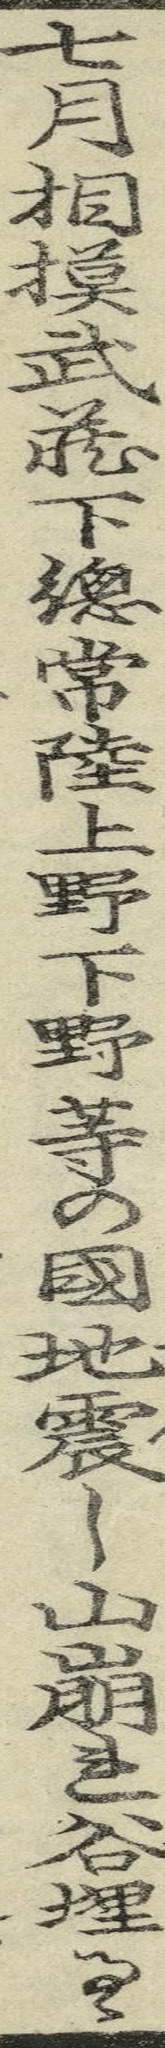七月相模武蔵下総常陸上野下野等の国地震し山崩れ谷埋るゝ
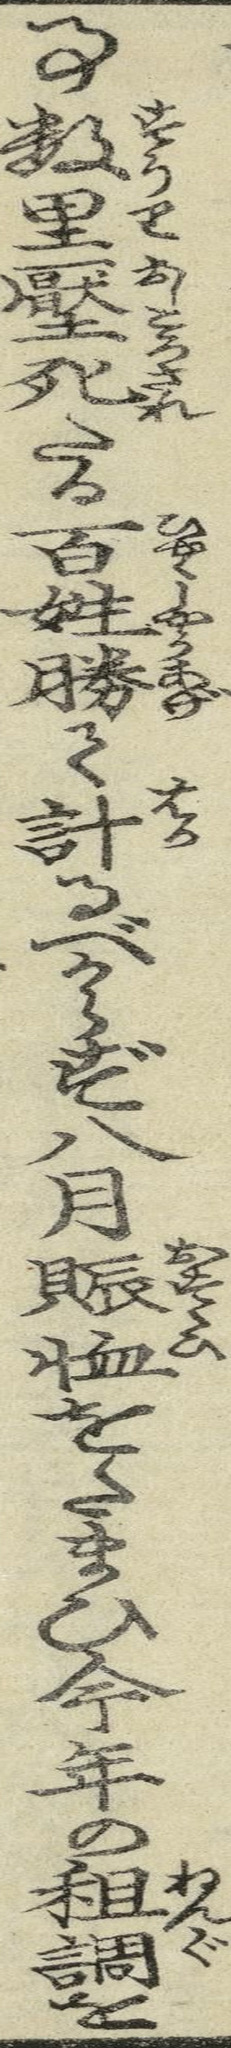事数里圧死たる百姓勝て計るべからず八月賑恤をたまひ今年の租調を
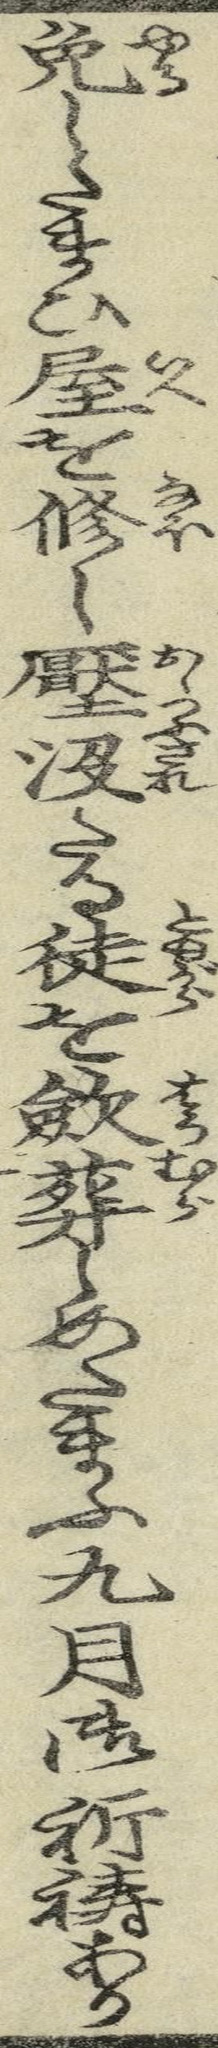免したまひ屋を修し圧没たる徒を斂葬しめたまふ九月御祈祷あり
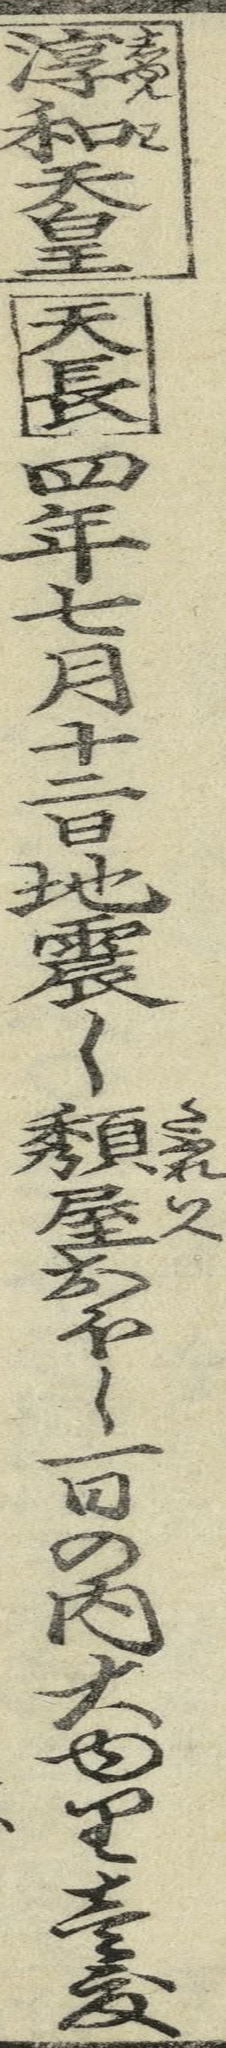淳和天皇天長四年七月十二日地震し頽屋おほし一日の内大ゆり壱度
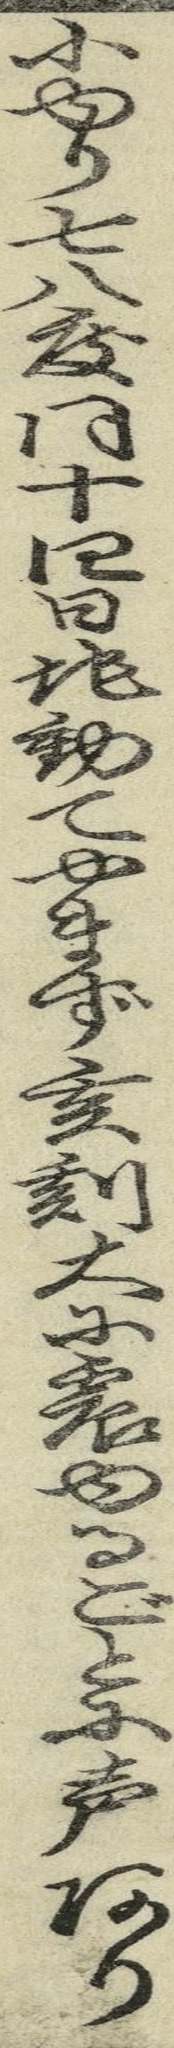小ゆり七八度同十四日地動てやまず亥刻大に震ゆるごとに声あり
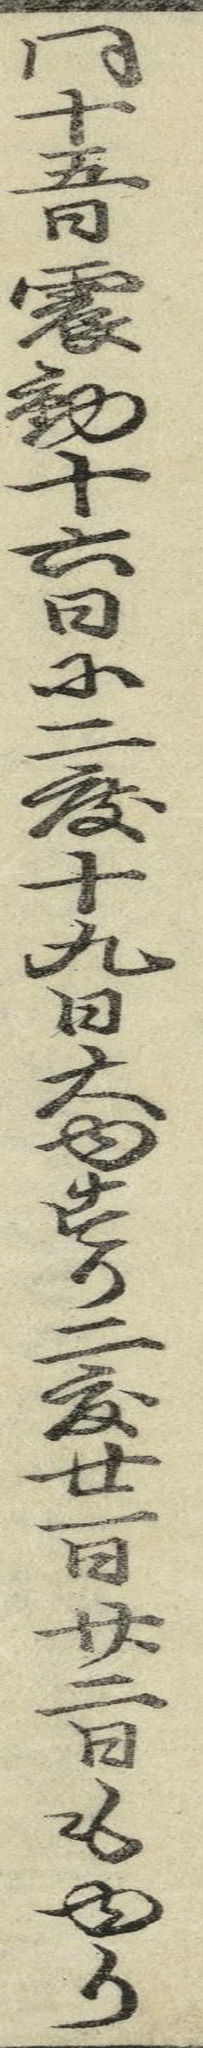同十五日震動十六日に二度十九日大ゆすり二度廿一日廿二日もゆり
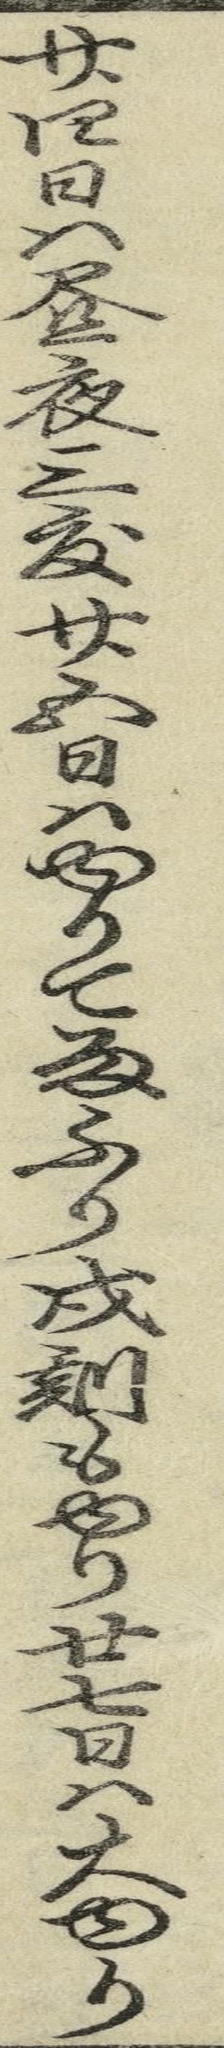廿四日は昼夜三度廿五日はゆりて雨ふり戌刻もゆり廿七日は大ゆり
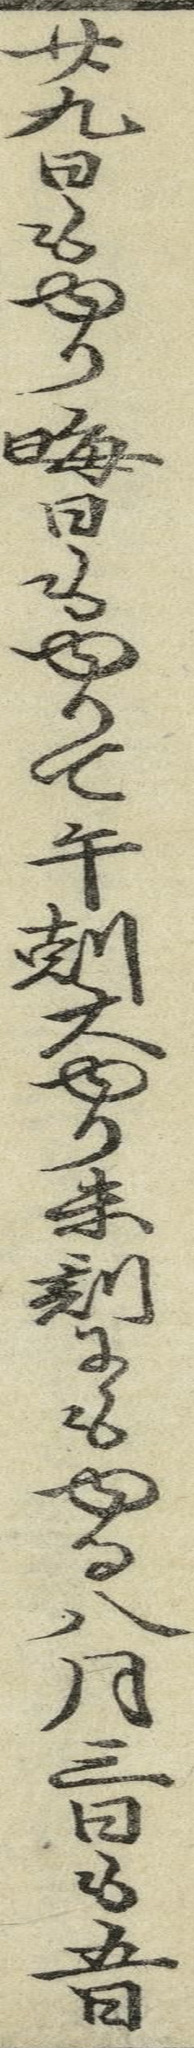廿九日もゆり晦日もゆりて午刻大ゆり未刻にもゆる八月三日も五日
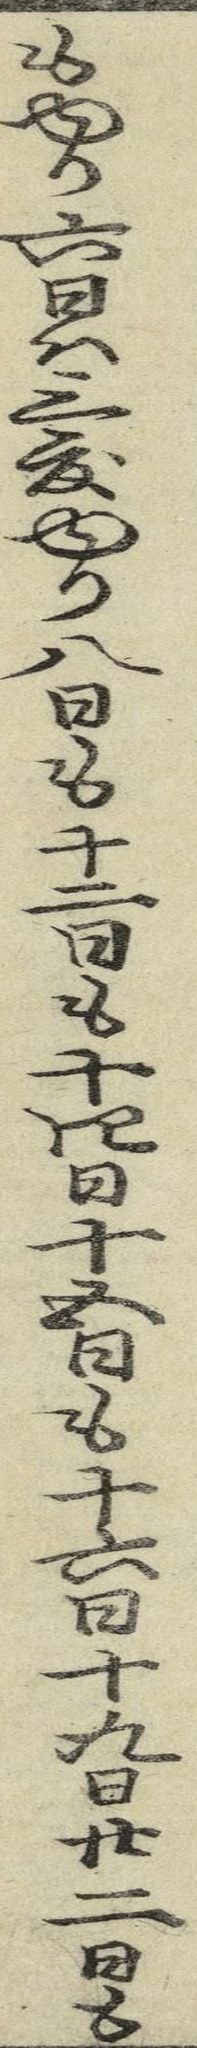もゆり六日は三度ゆり八日も十二日も十四日十五日も十六日十九日廿二日も
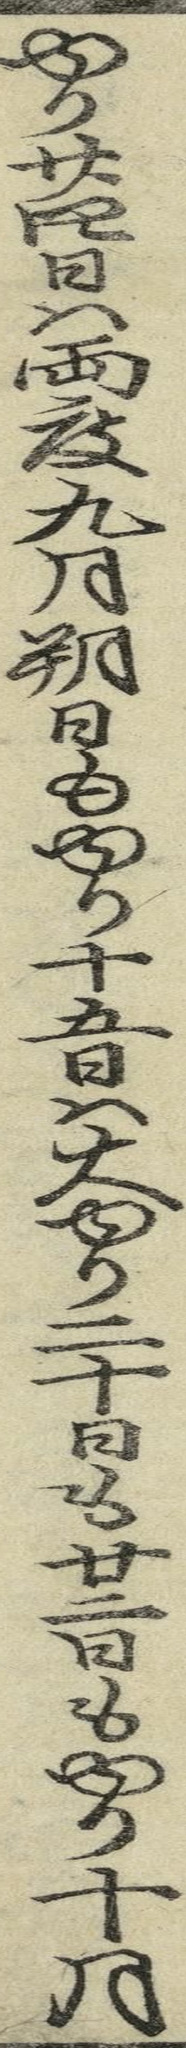ゆり廿四日は両度九月朔日もゆり十五日は大ゆり二十日も廿二日もゆり十月

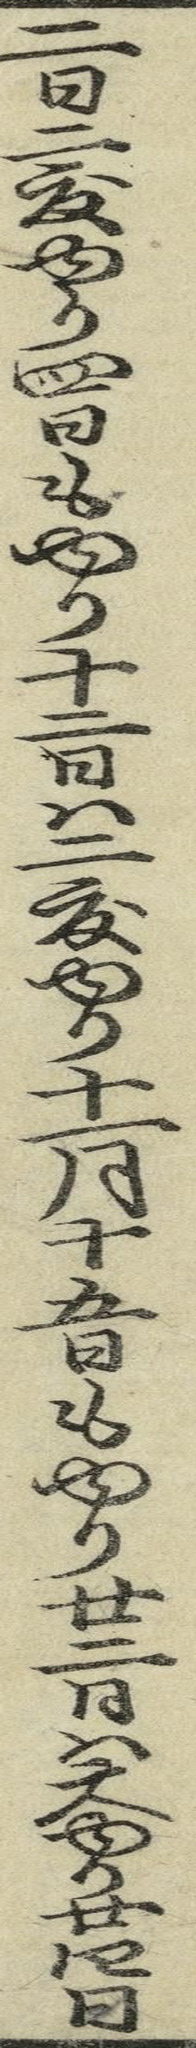二日二度ゆり四日もゆり十二日は二度ゆり十一月十五日もゆり廿二日は大ゆり廿四日
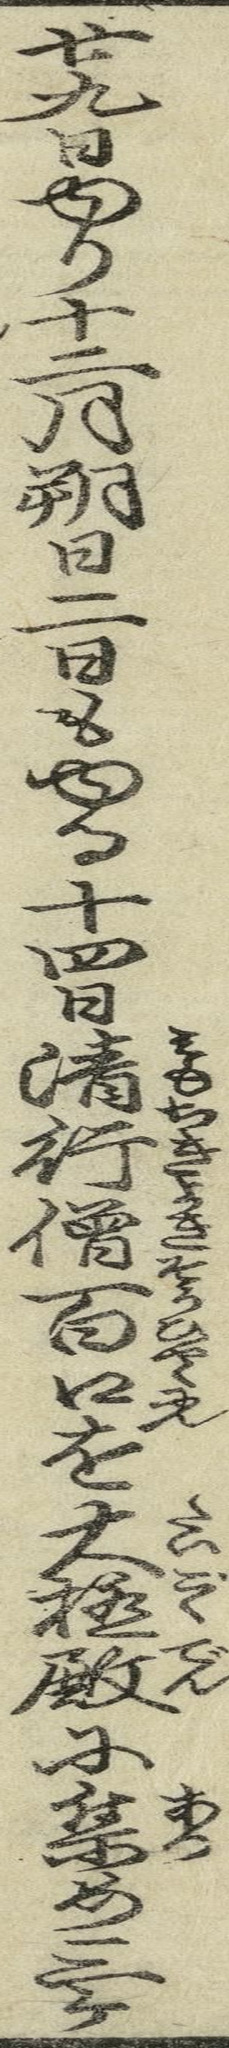廿九日ゆり十二月朔日二日もゆる十四日清行僧百口を大極殿に集め三ヶ
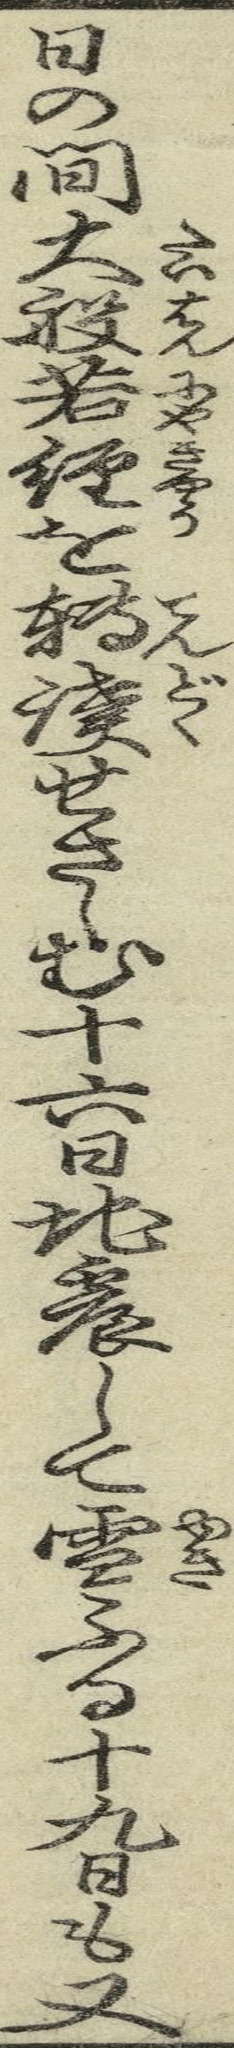日の間大般若経を転読せさしむ十六日地震して雪ふる十九日も又
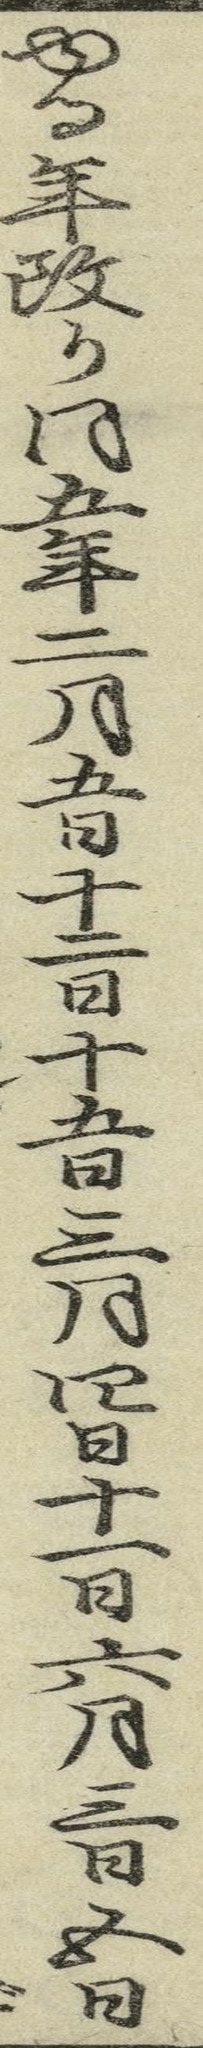ゆる年改り同五年二月五日十二日十五日三月四日十一日六月三日五日
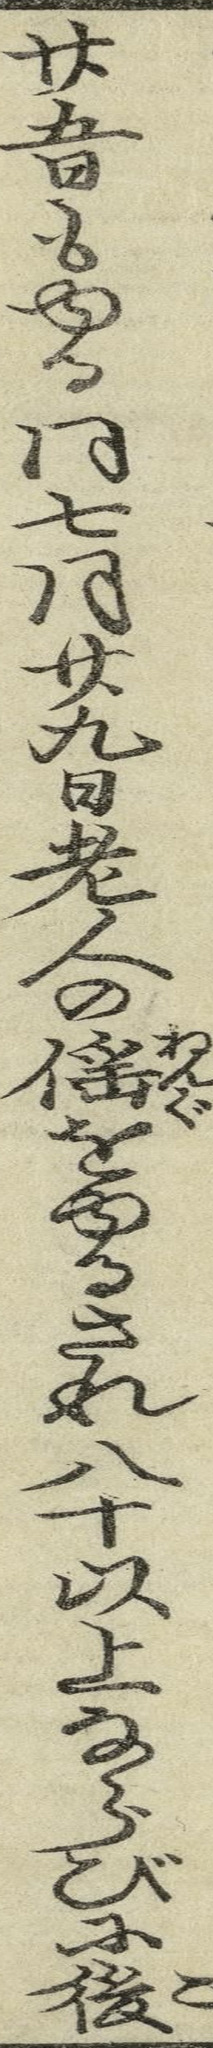廿五日もゆる同七月廿九日老人の傜をゆるされ八十以上ならびに後
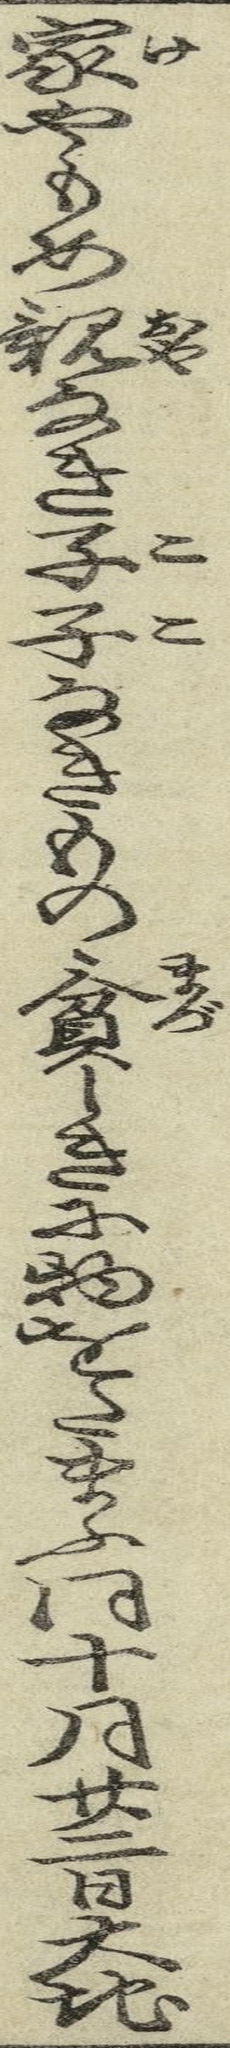家やもめ親なき子子なきものの貧しきに物をたまふ同十月廿二日大地
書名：地震年代記
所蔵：東京大学地震研究所図書室 Earthquake Research Institute Library, The University of Tokyo, JAPAN
